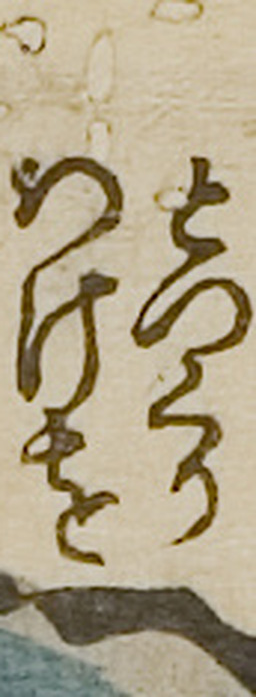わけを
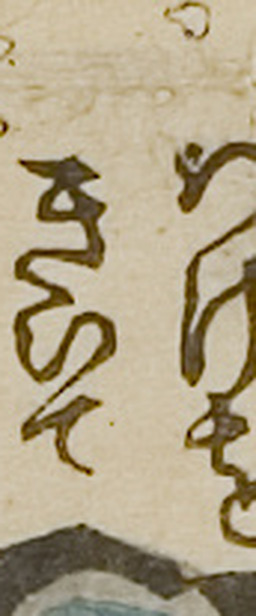きいて
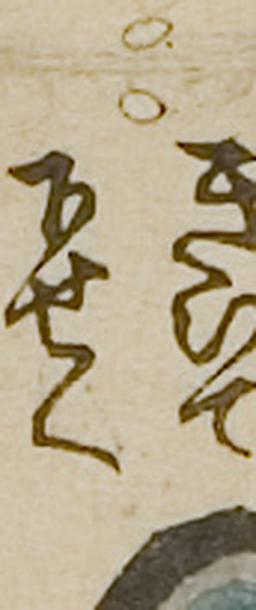下せへ
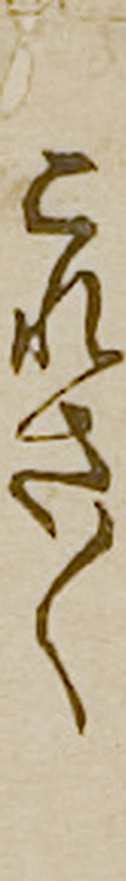これさ〳〵
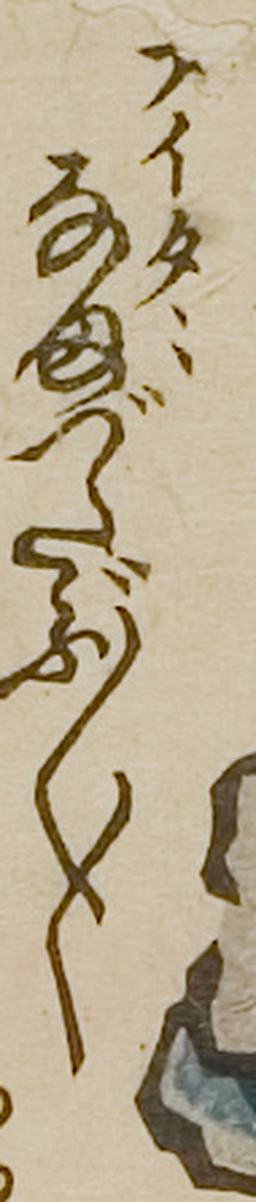なまづだぶ〳〵〳〵
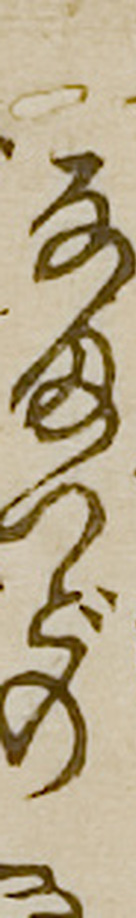なまつどの
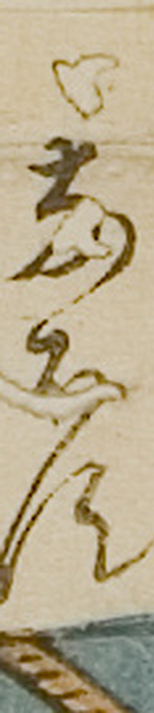なほす
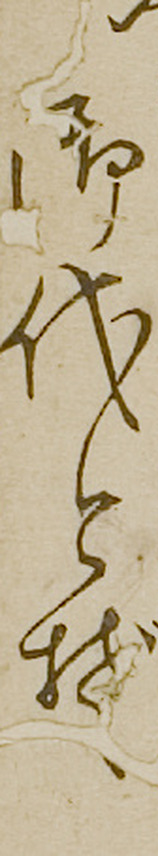御代とぞ
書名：[鯰へのこらしめ]
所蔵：東京大学総合図書館 General Library in the University of Tokyo, JAPAN
